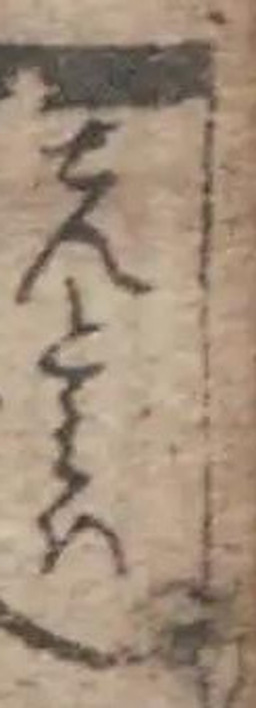てんとミハ
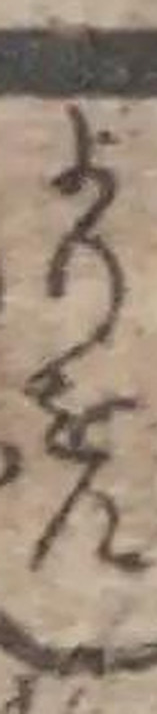よりをん
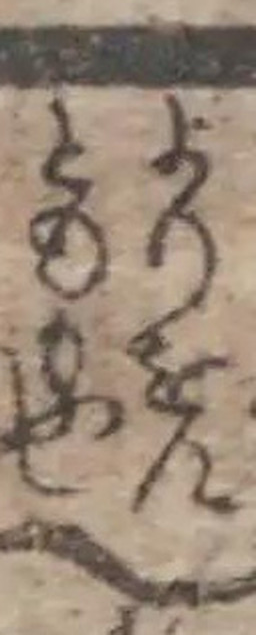とももふし
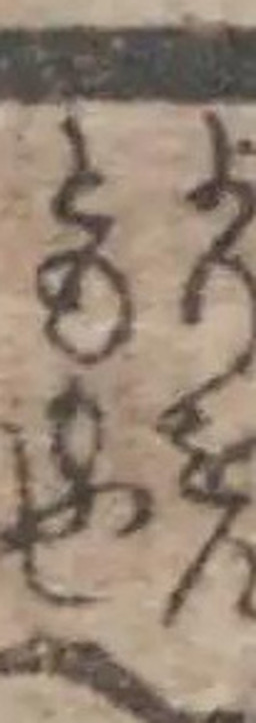とももふし
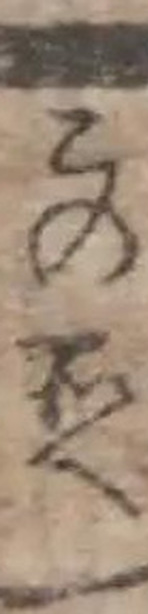この所へ
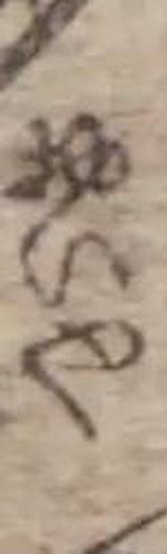おいや
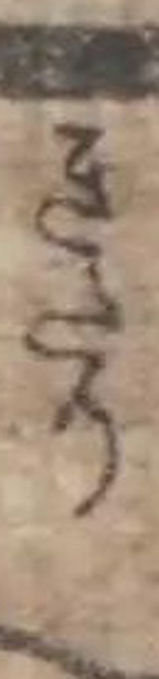きたり
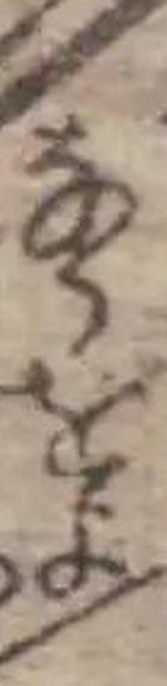ならおよ
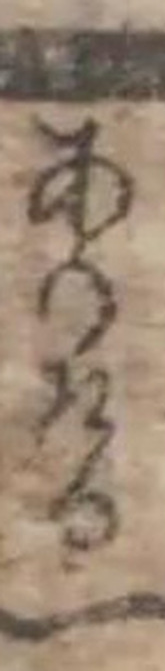ありける
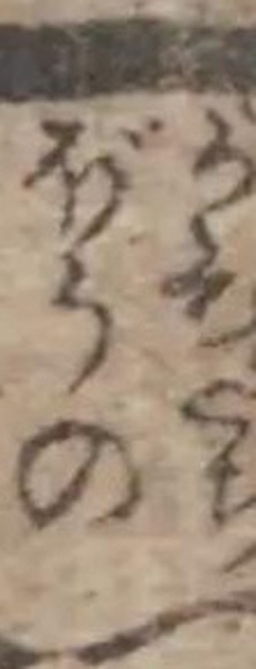ぼうの
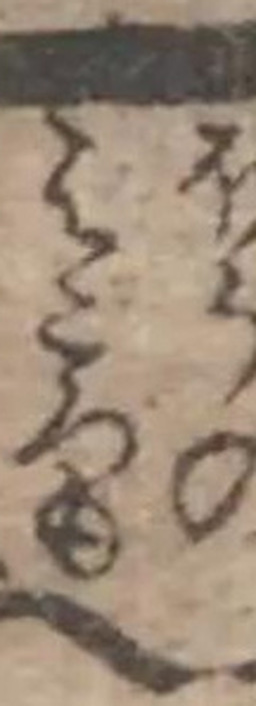はころも
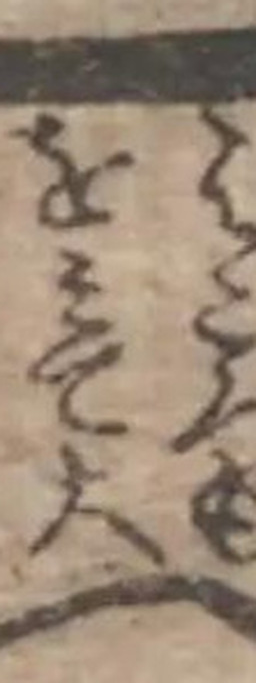をミて大
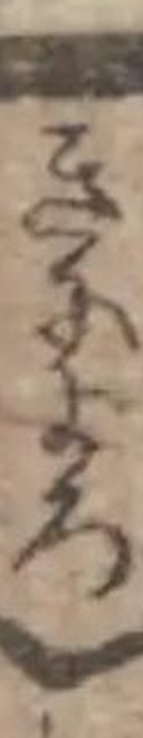きによろ
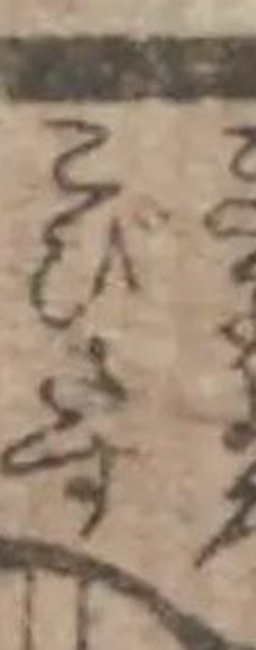こびさす
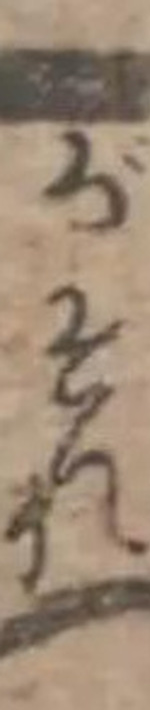がそれ
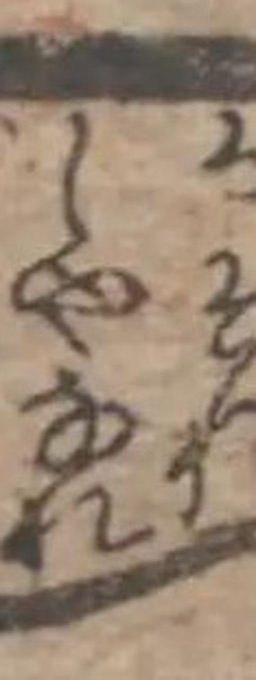しやなれ
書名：草紙の曙 3巻
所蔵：国立国会図書館 National Diet Library, JAPAN
